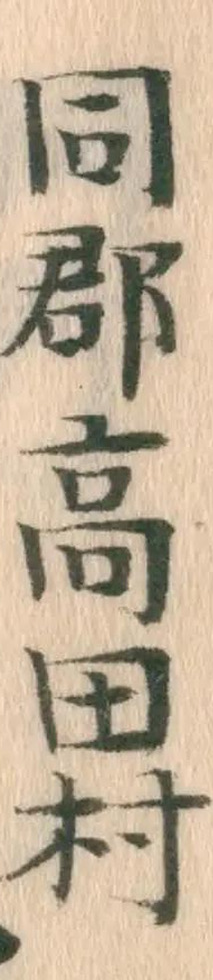同郡高田村
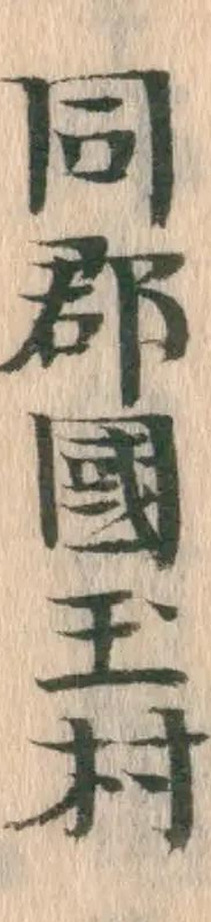同郡国玉村
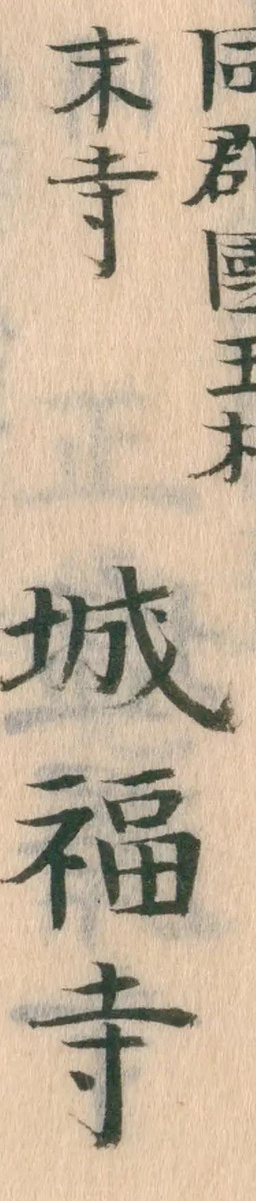未寺城福寺
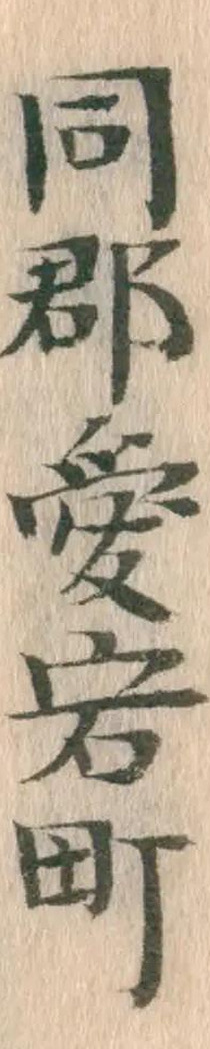同郡愛宕町
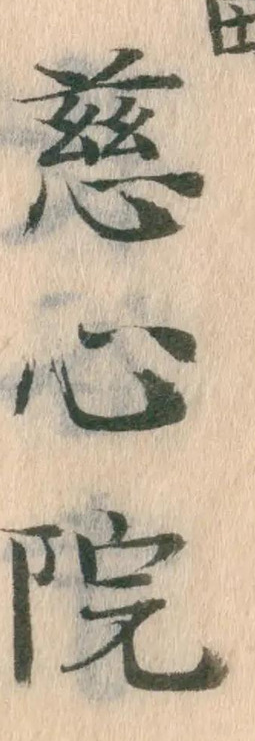慈心院
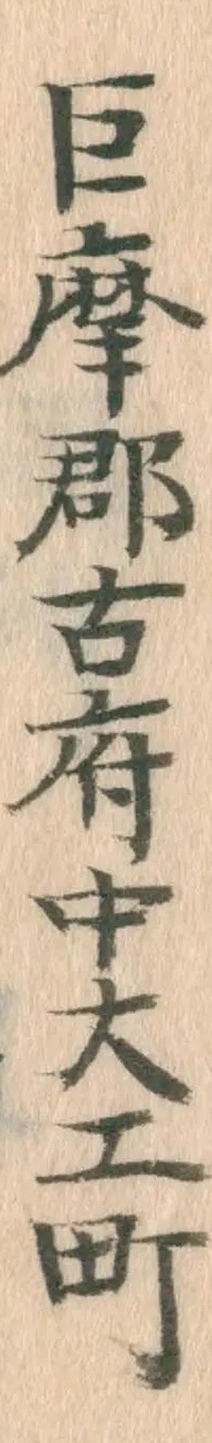巨摩郡古府中大工町

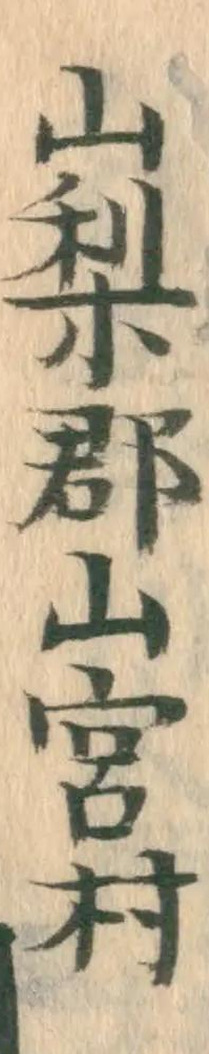山梨郡温泉村
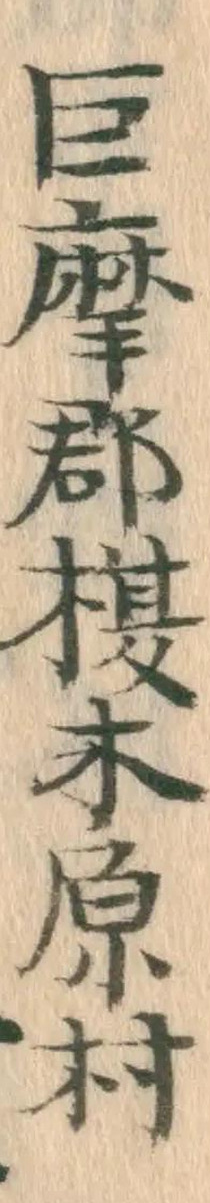巨摩郡榎木原村
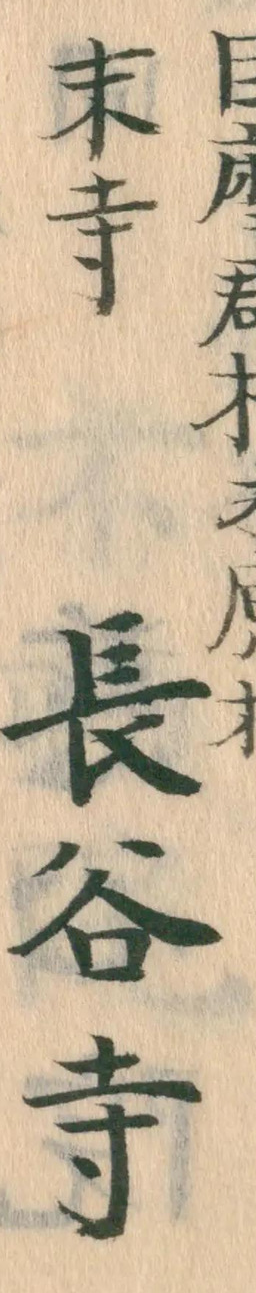未寺長谷寺
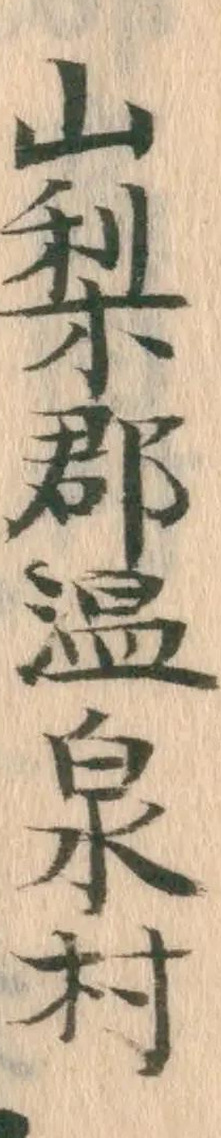山梨郡温泉村
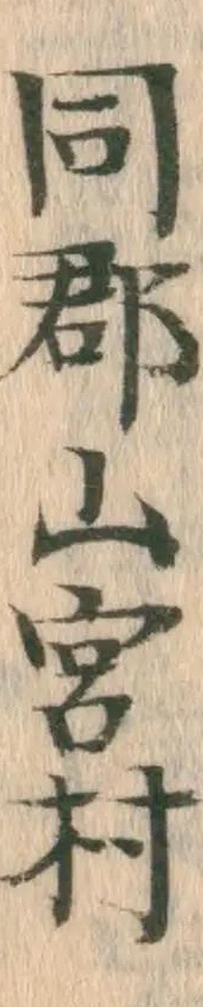同郡山宮村
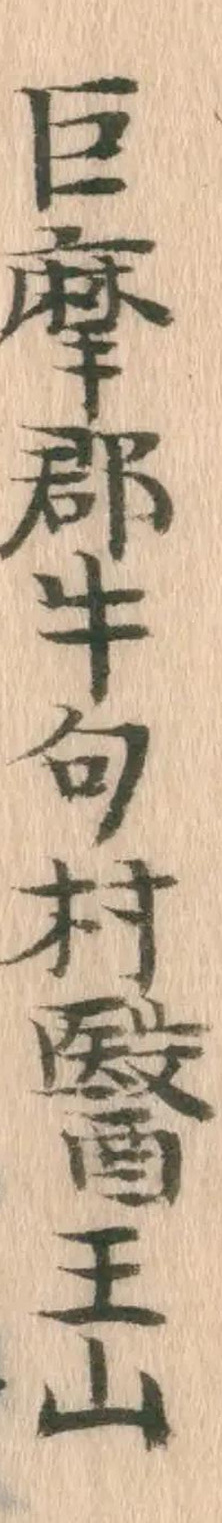巨摩郡牛句村医王山
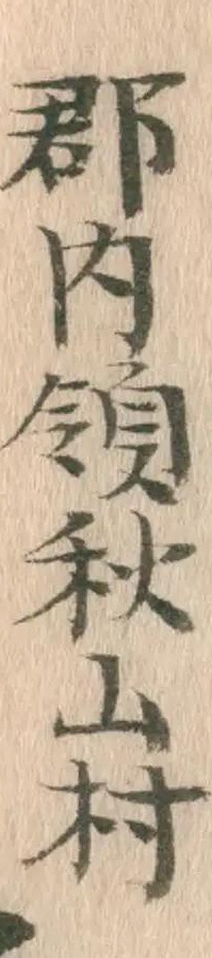郡内領秋山村
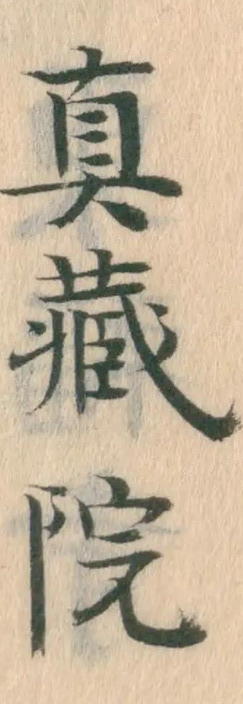真蔵院

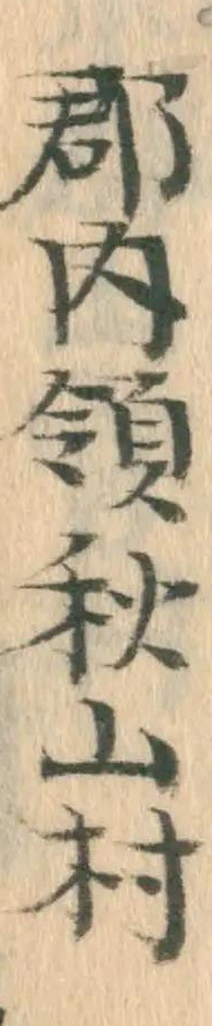郡内領秋山村
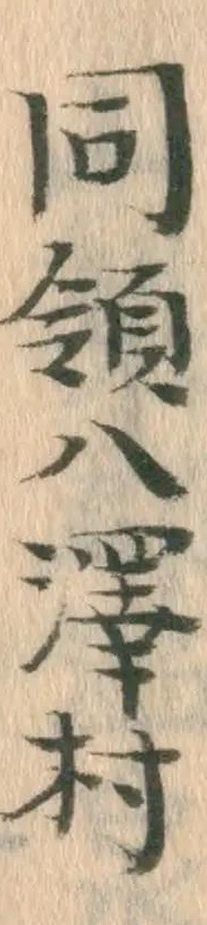同領八沢村
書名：古義真言宗本末帳 21巻. [4] 第三 伊賀国、伊勢国、志摩国、尾張国、三河国、遠江国、駿河国、伊豆国、甲斐国
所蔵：国立国会図書館 National Diet Library, JAPAN
